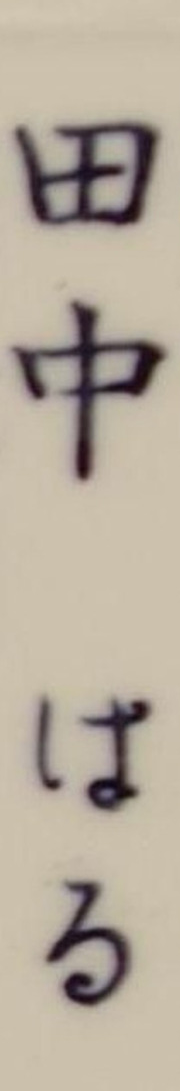田中はる
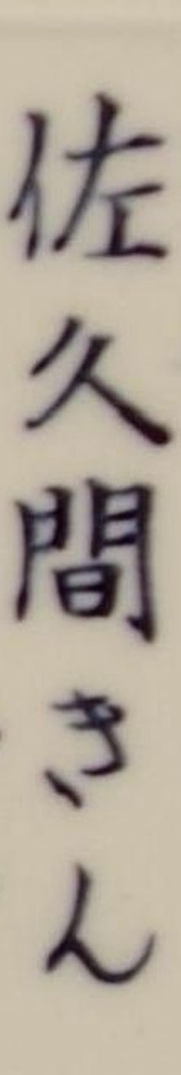佐久間きん
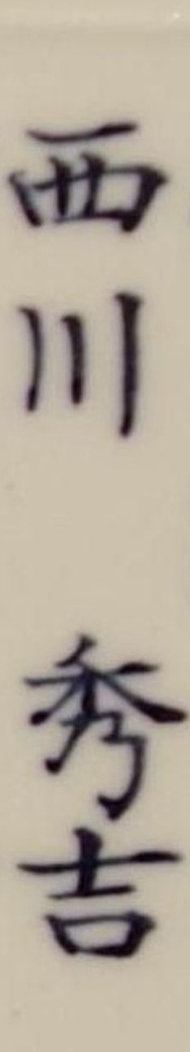西川秀吉
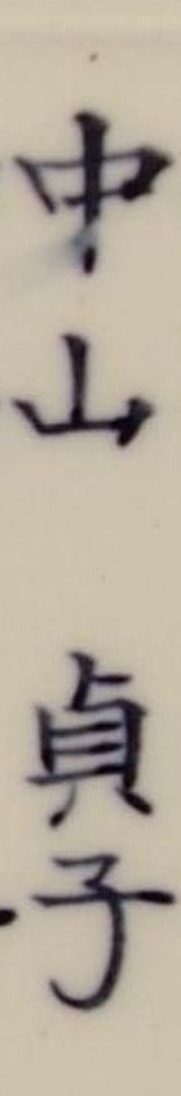中山貞子
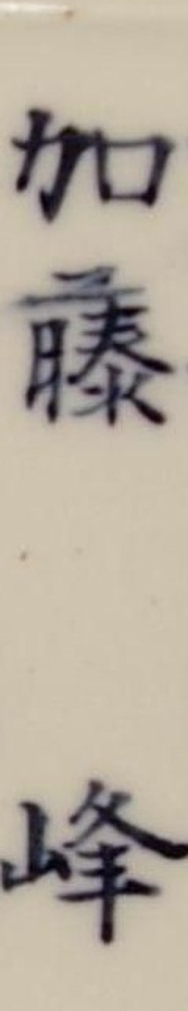加藤峰
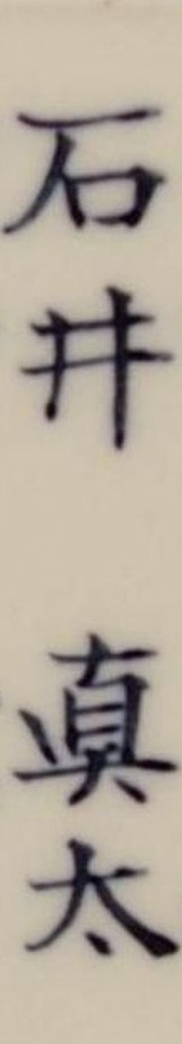石井真太
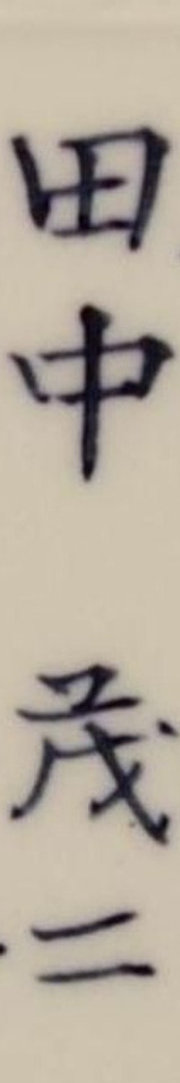田中茂二
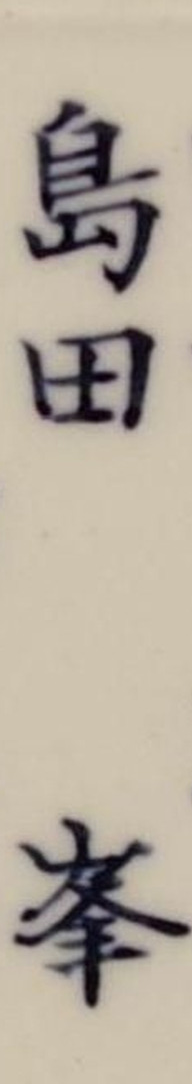島田峯
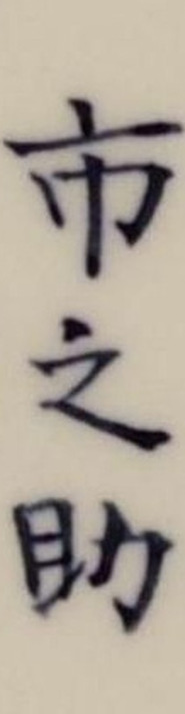市之助
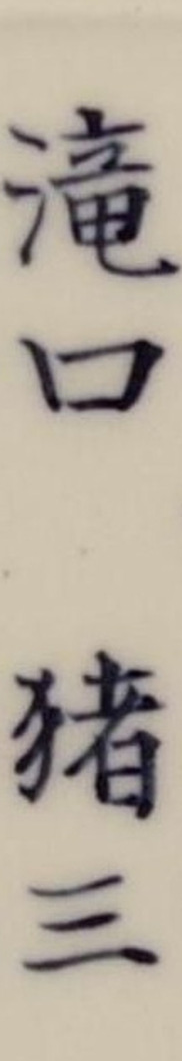滝口猪三
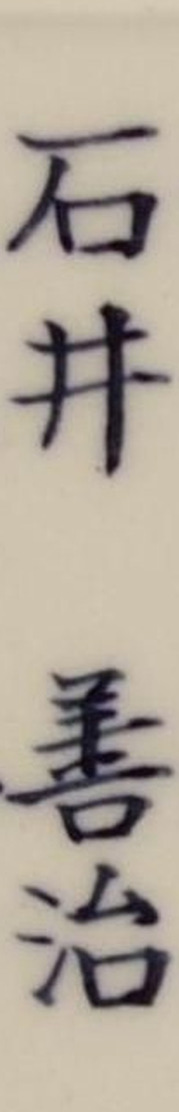石井善治
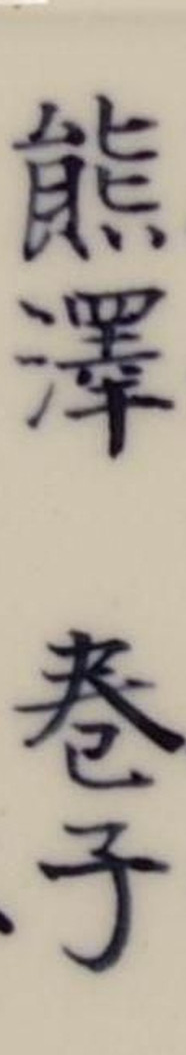熊澤巻子
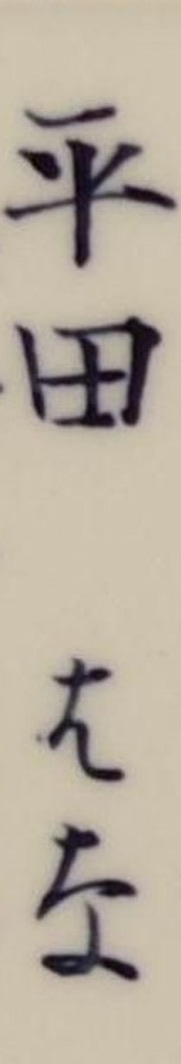平田はな
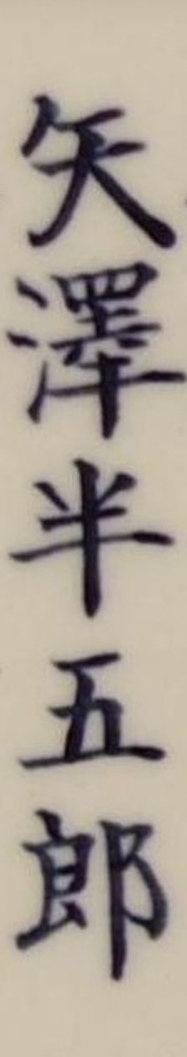矢澤半五郎
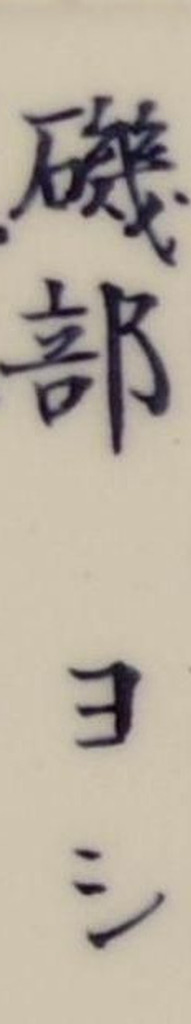磯部ヨシ
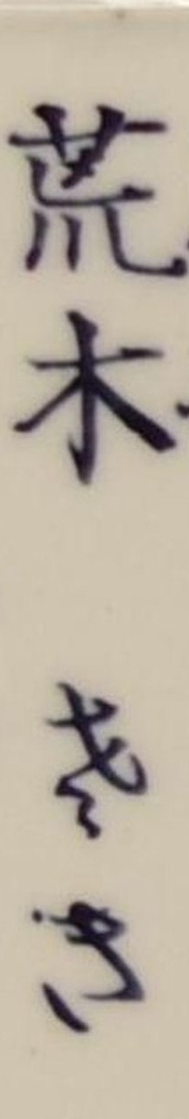荒木さき
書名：M~S
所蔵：高野山金剛峯寺
